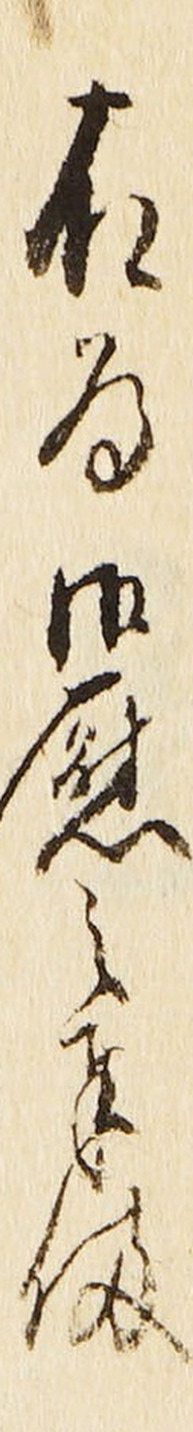右為御慰之奉備
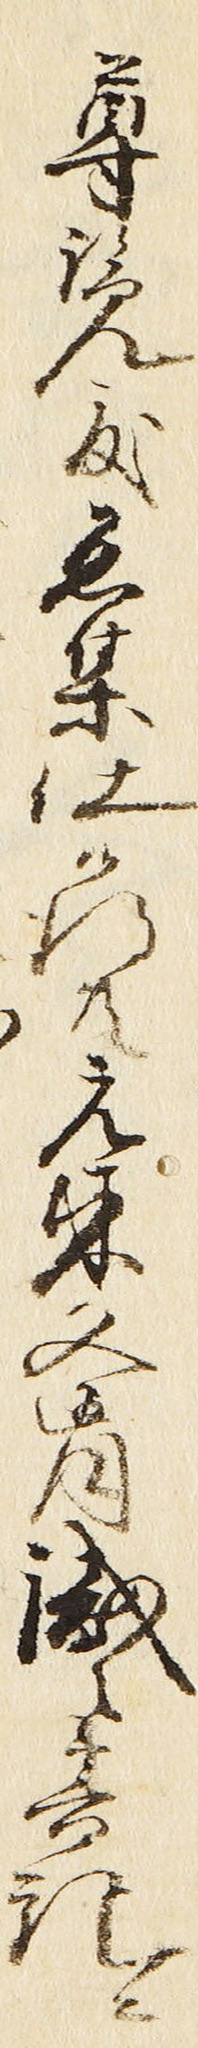尊覧度急集仕候得共元来文盲識之寄記ニ
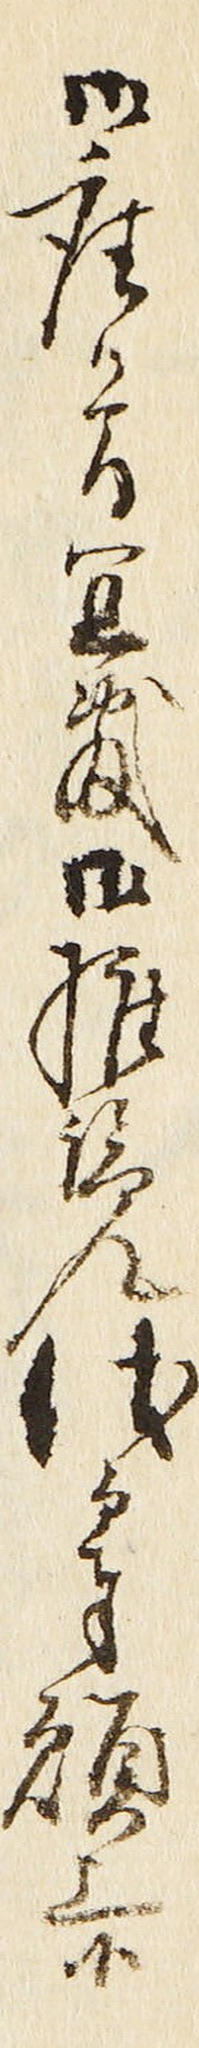御座候間宜敷御推覧伏而奉願上候
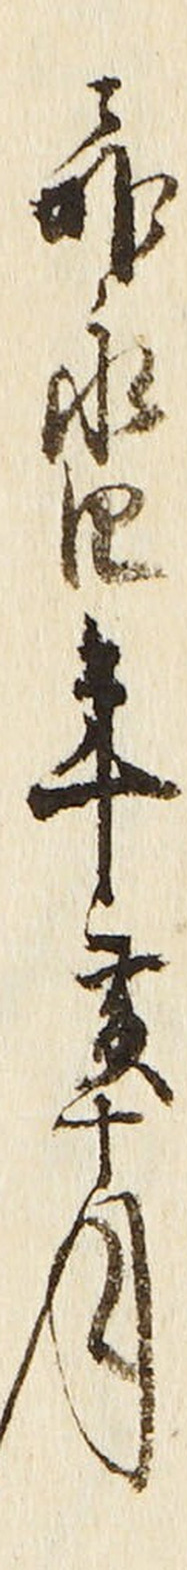嘉永四年亥十月

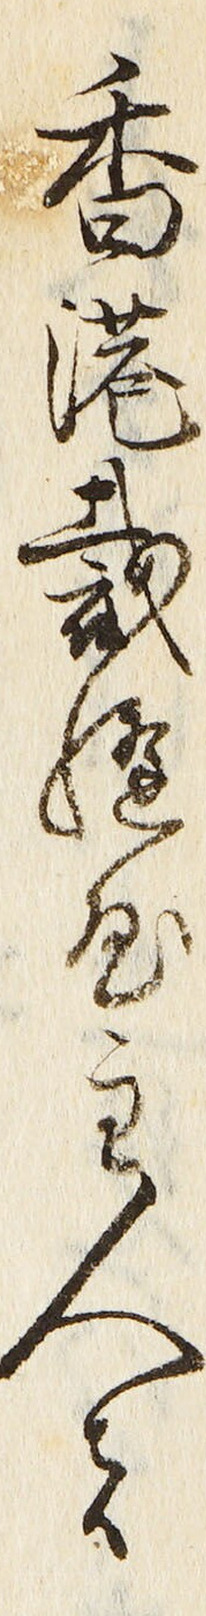香港裁縫屋主人は
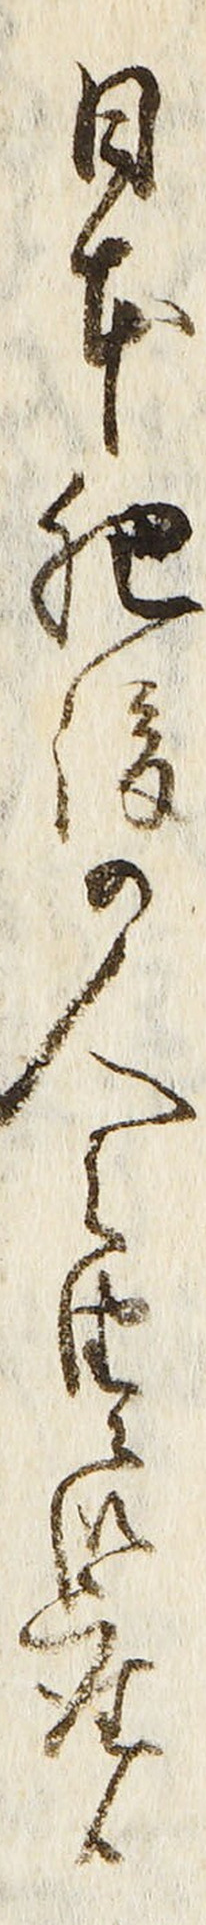日本肥後の人之由ニ御座候
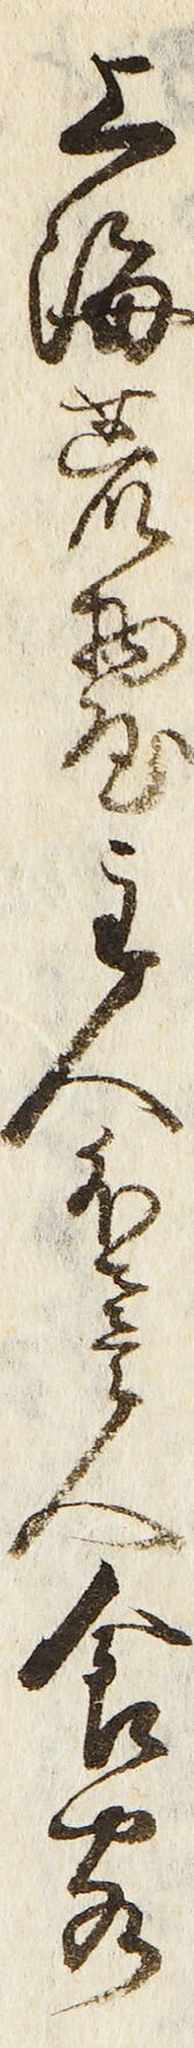上海荒物屋主人外ニ壱人食客
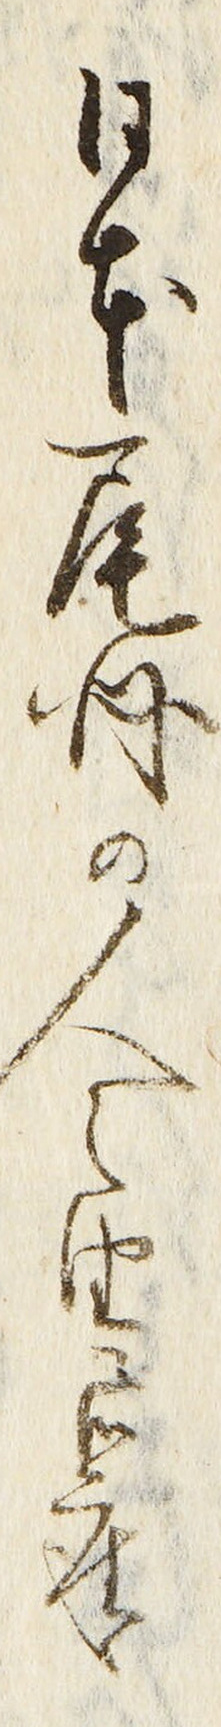日本尾州の人之由ニ御座候
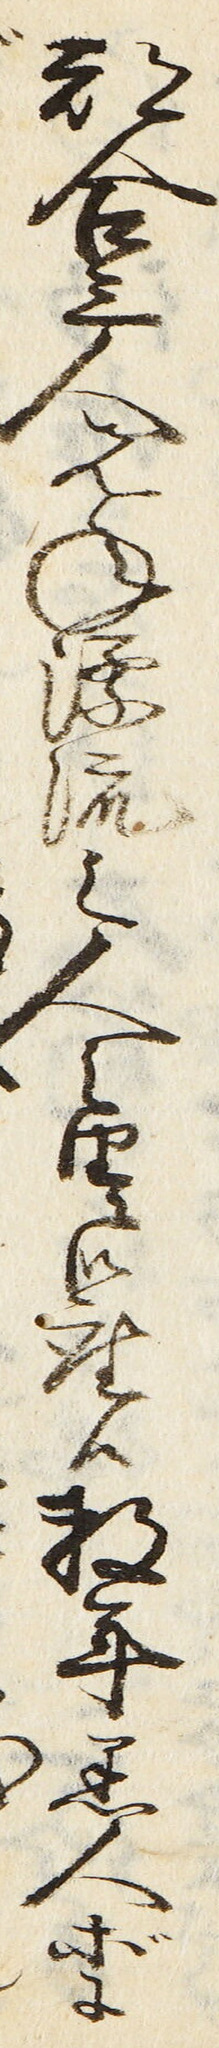都合三人先年漂流之人之由ニ御座候数年黒人ボネ
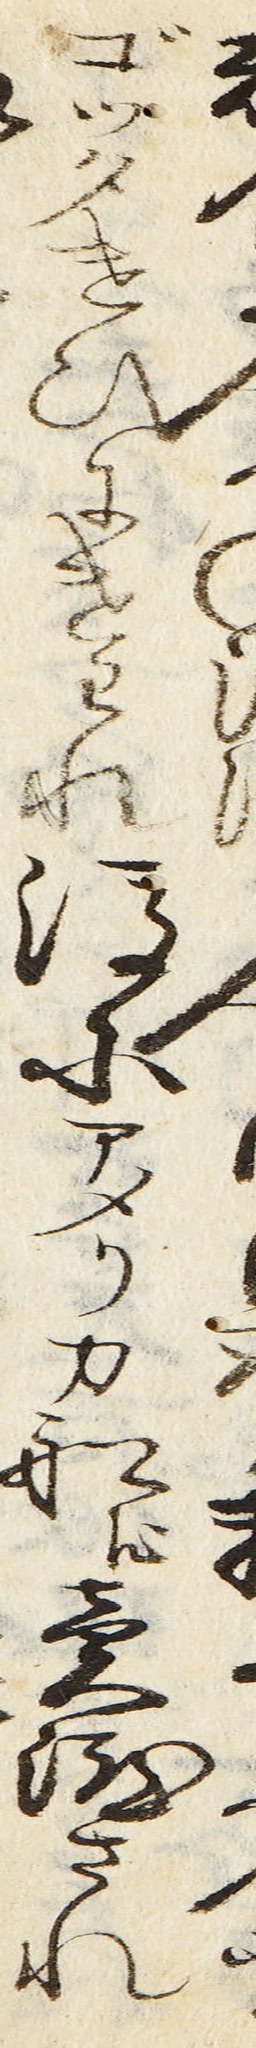ゴツタ遣ひに遣われ後にアメリカ船え売渡され
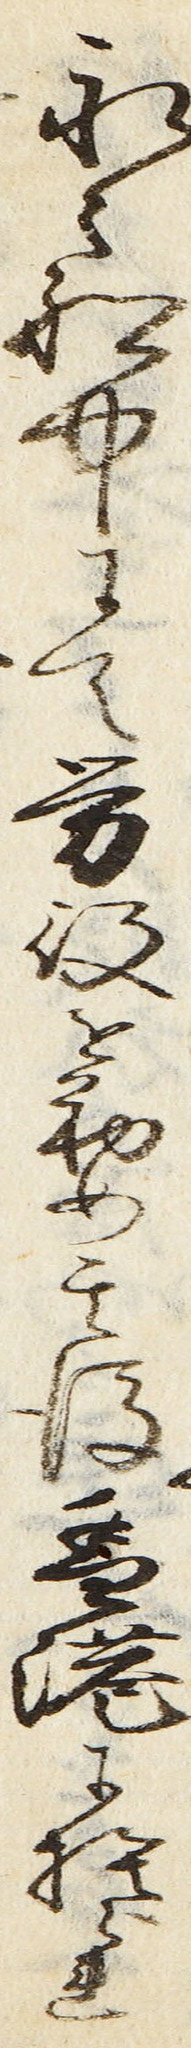永々船中にて労役を勤め其後香港に捨られ
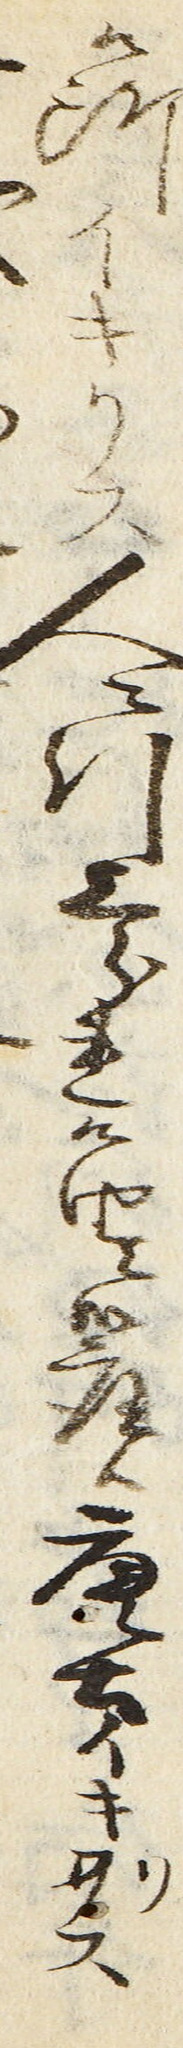候所イキリス人ニ引上られ候由ニ御座候唐土イキリス
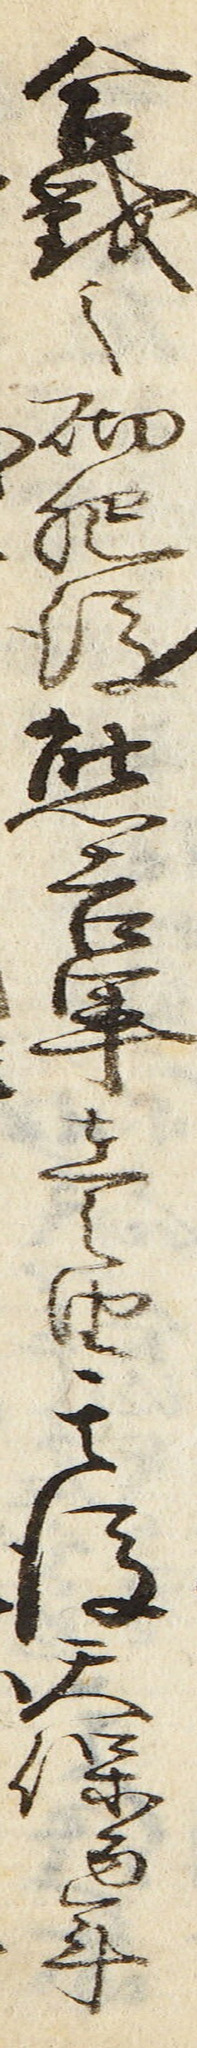合戦之砌肥後熊吉軍在之由其後天保酉年
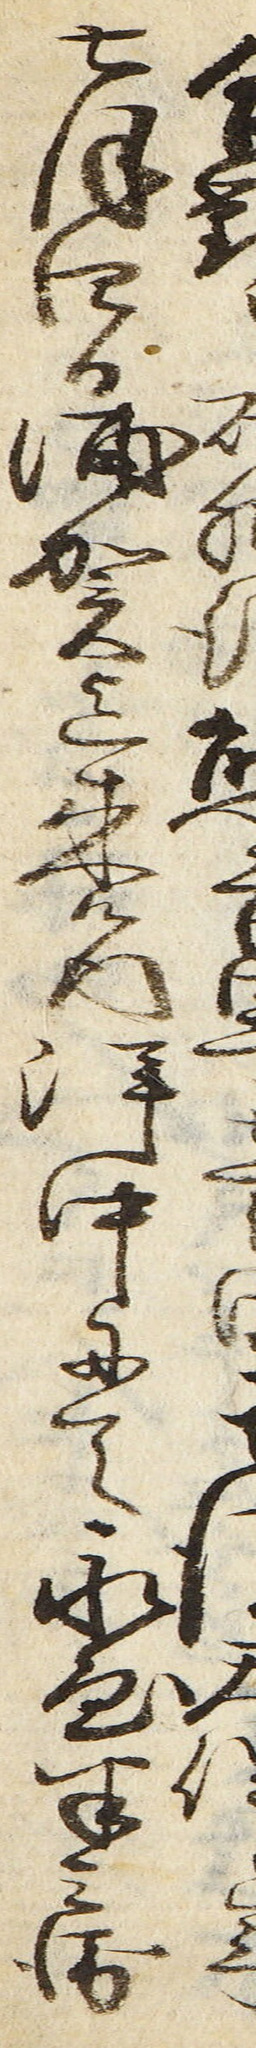七月四日浦賀迄来ル内洋中にて永屋半兵衛

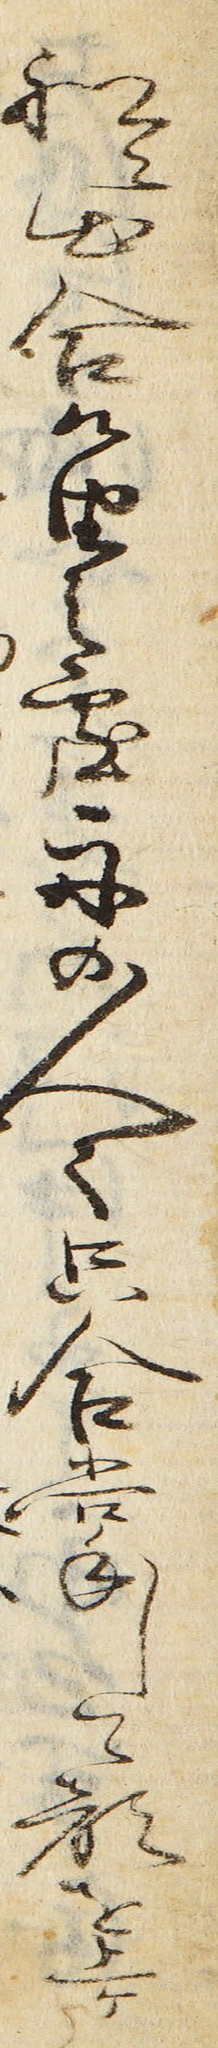船ニ出合候由之処舟の人々只合掌して顔を上ケ
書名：亜墨利加漂流記聞
